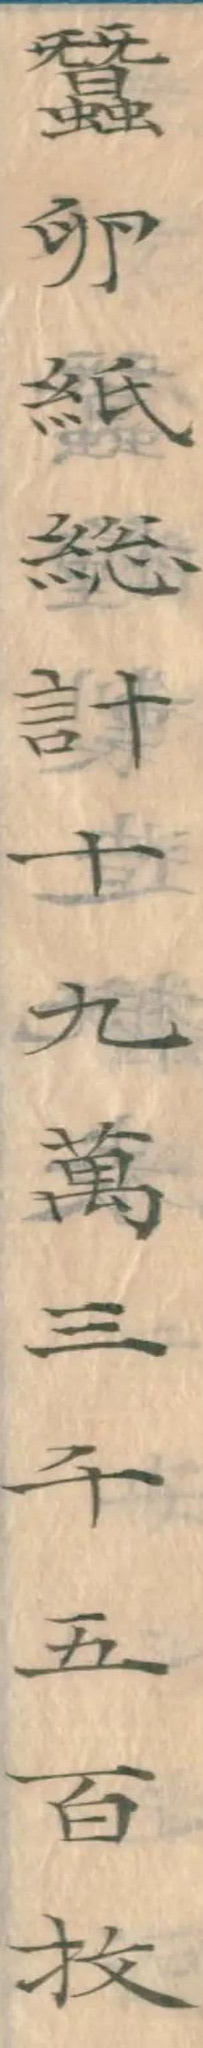蚕卵紙総計十九万三千五百枚
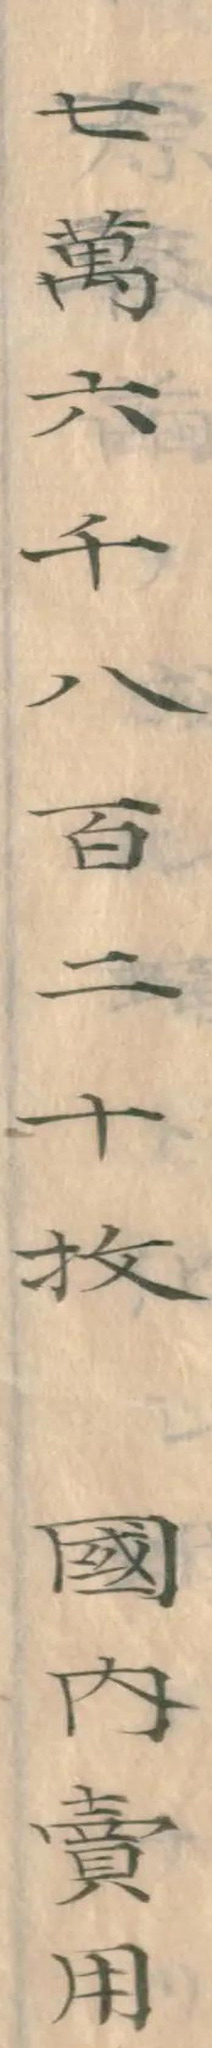┌七万六千八百二十枚国内売用
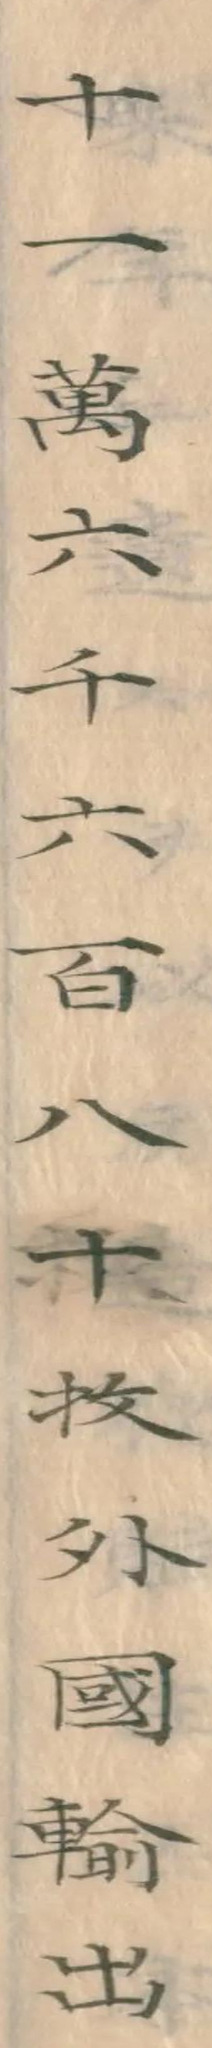└十一万六千六百八十枚外国輪出
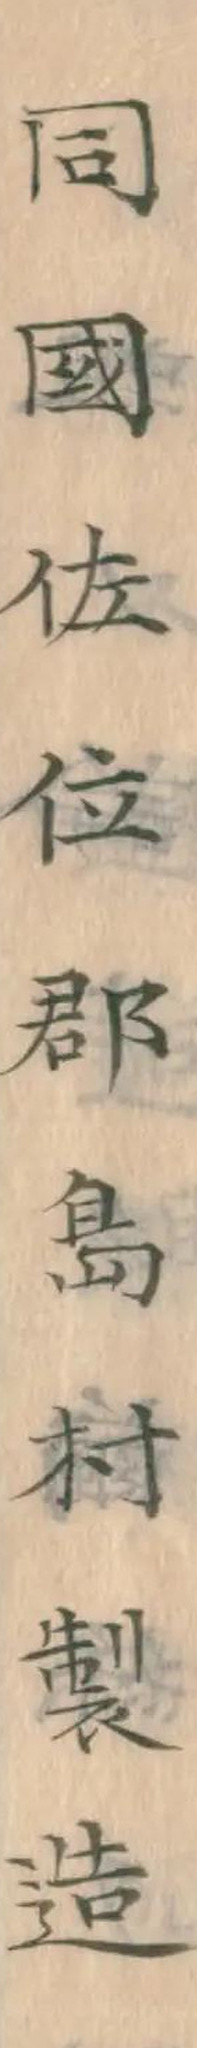同国佐位郡島村製造
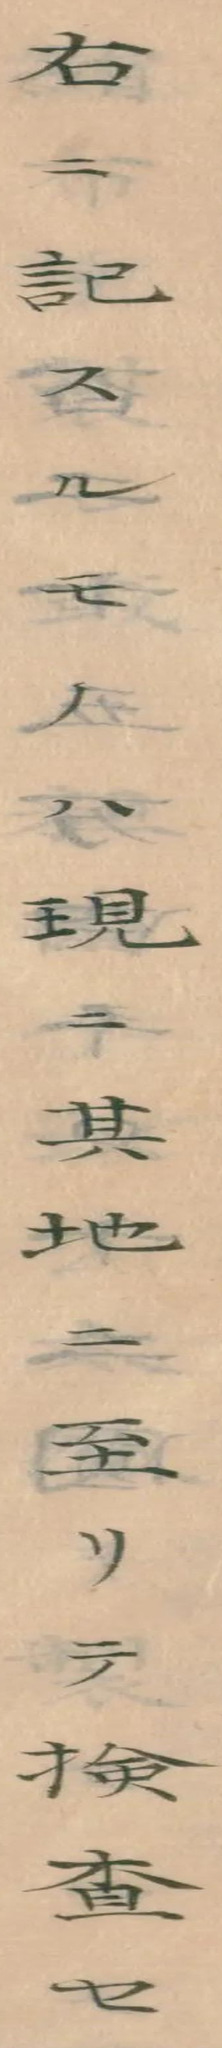右ニ記スルモノハ現ニ其地ニ至リテ𢮦査セ
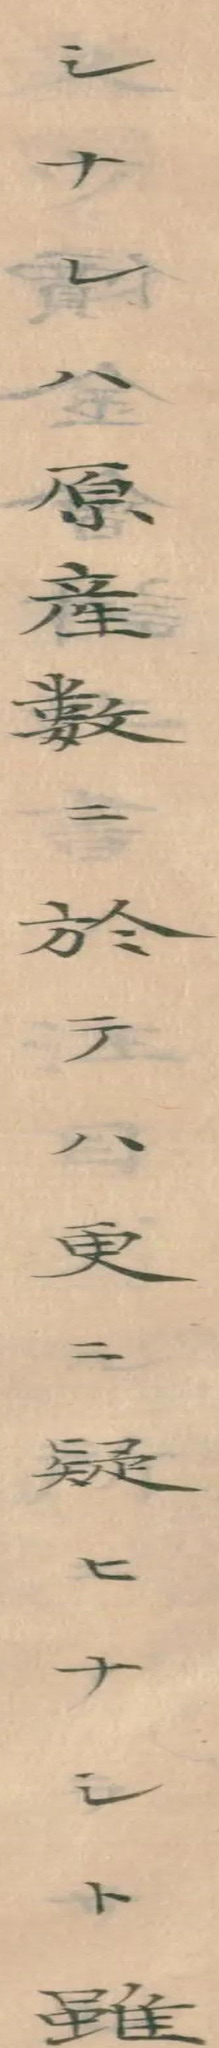シナレハ原産数ニ於テハ更ニ疑ヒナシト雖
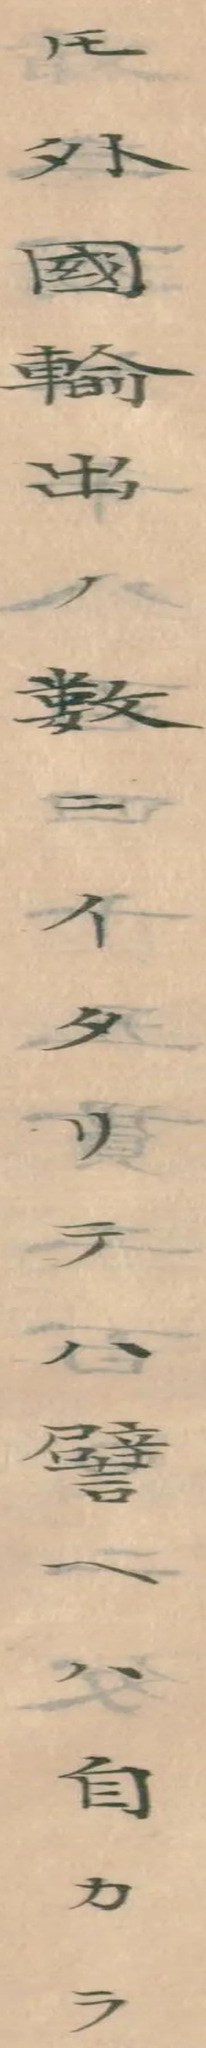トモ外国輸出ノ数ニイタリテハ譬ヘハ自カラ
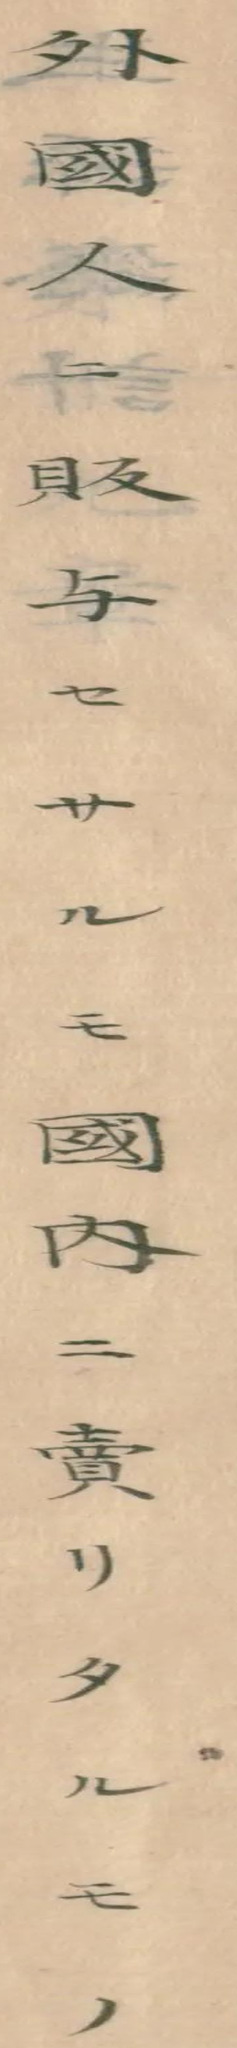外国人ニ販与セサルモ国内ニ売リタルモノ
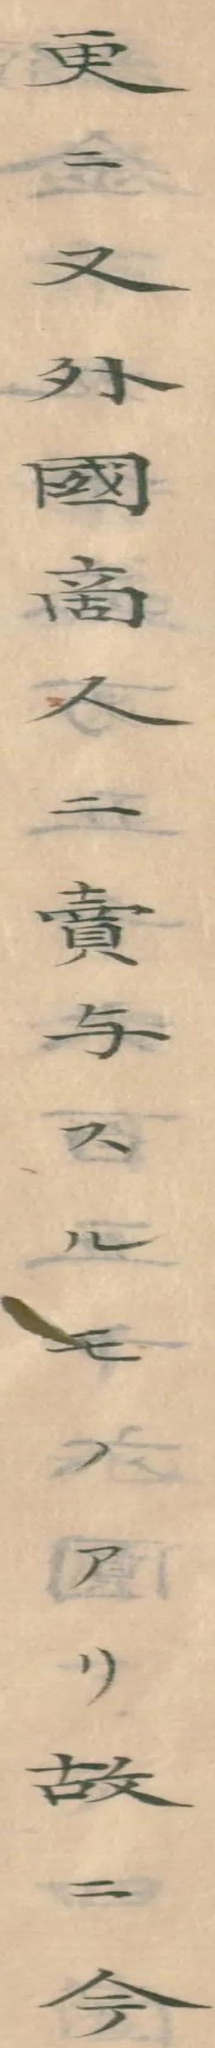更ニ又外国啇人ニ売与スルモノアリ故ニ今
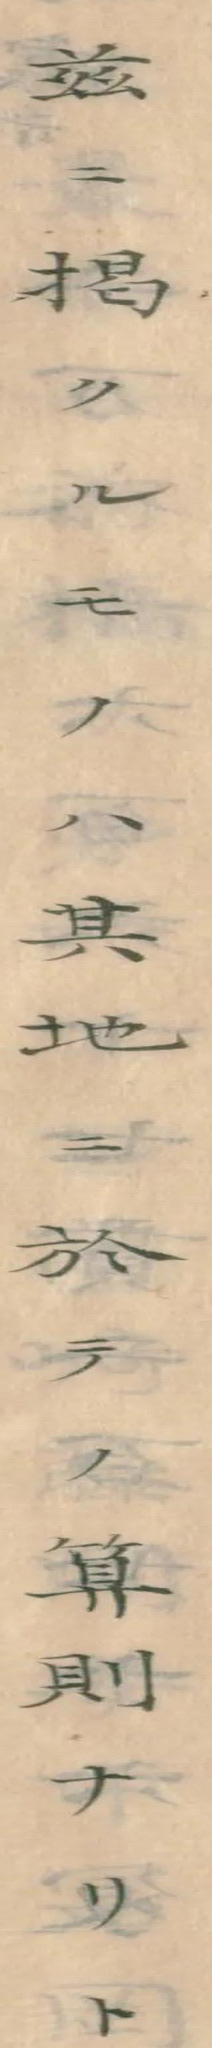茲ニ掲クルモノハ其地ニ於テノ算則ナリト
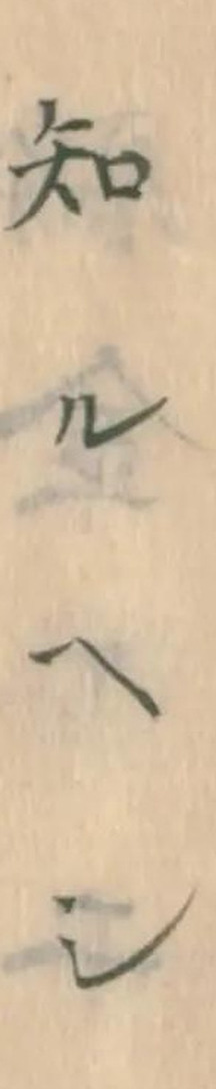知ルヘシ
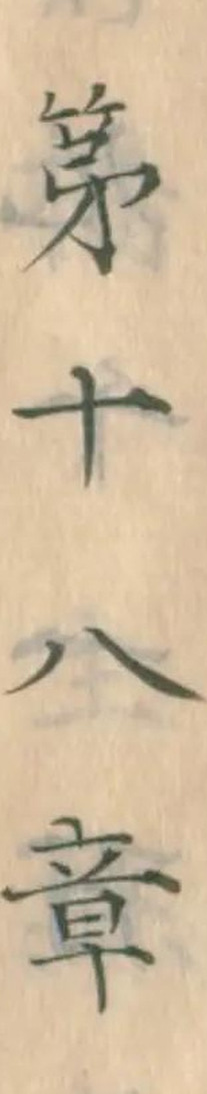第十八章
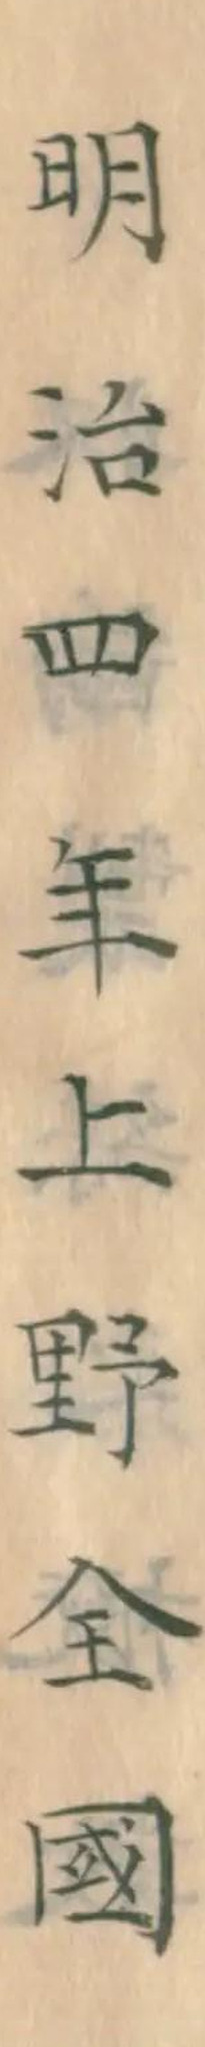明治四年上野全国

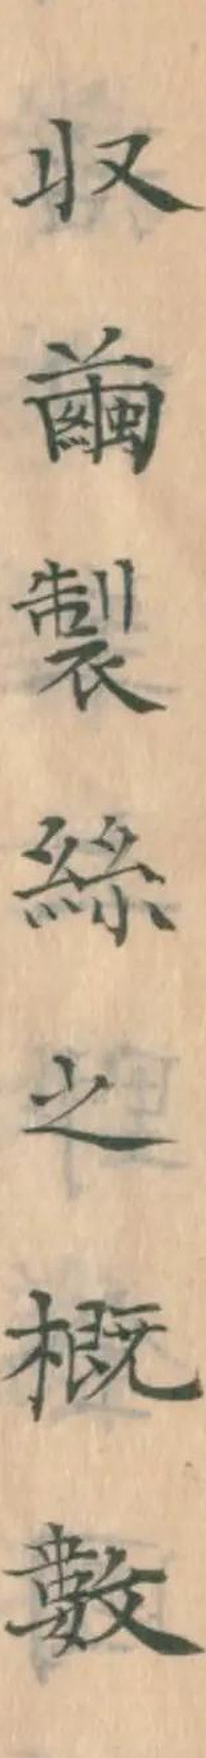収繭製糸之概数
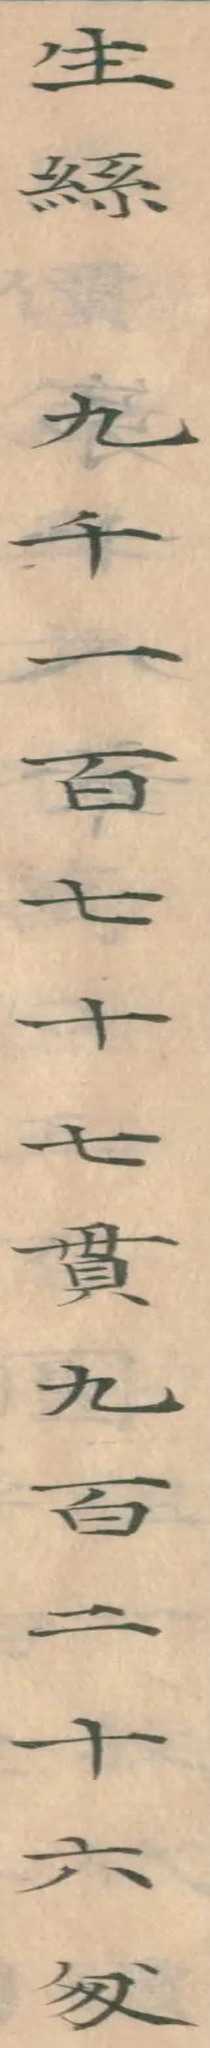生糸九千一百七十七貫九百二十六匁
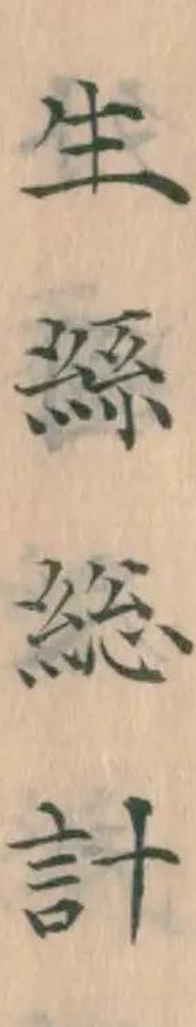生糸総計
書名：蚕桑集成
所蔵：国立国会図書館 National Diet Library, JAPAN
